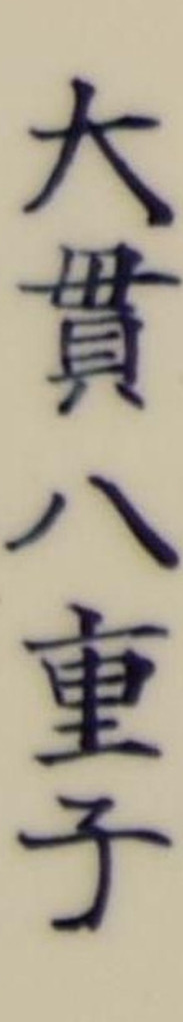大貫八重子
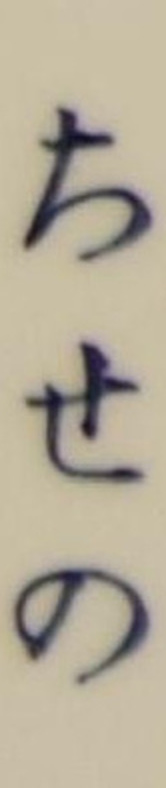ちせの

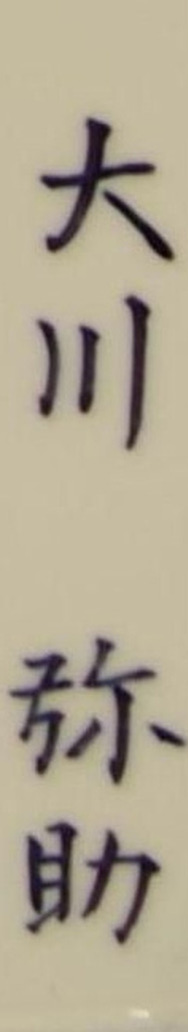大川弥助
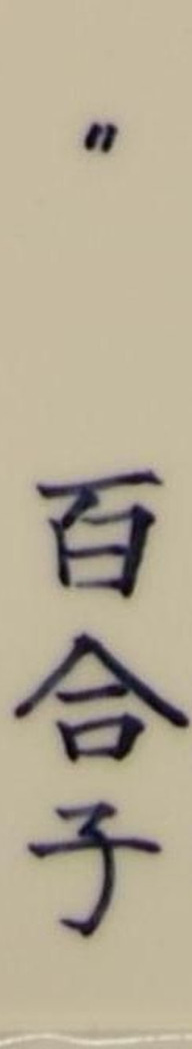百合子
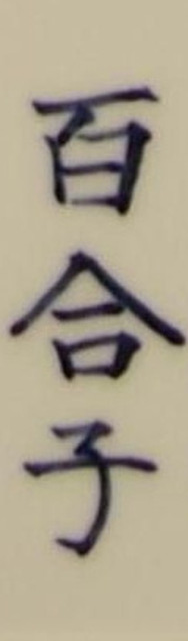百合子
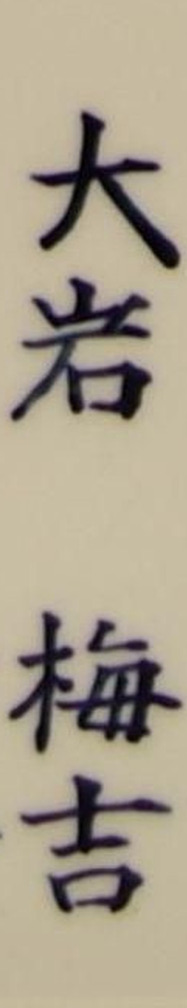大岩梅吉
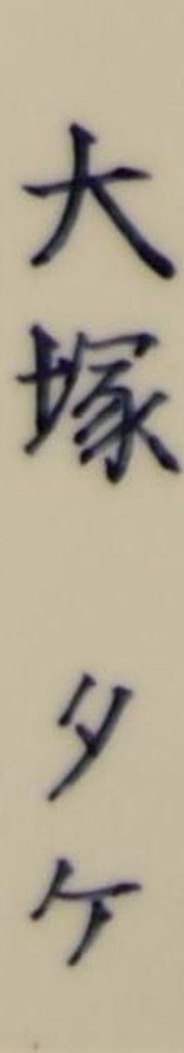大塚タケ
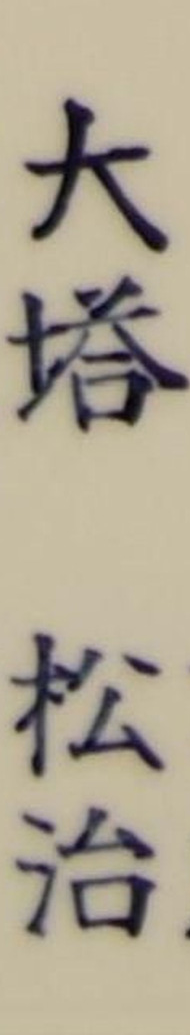大塔松治
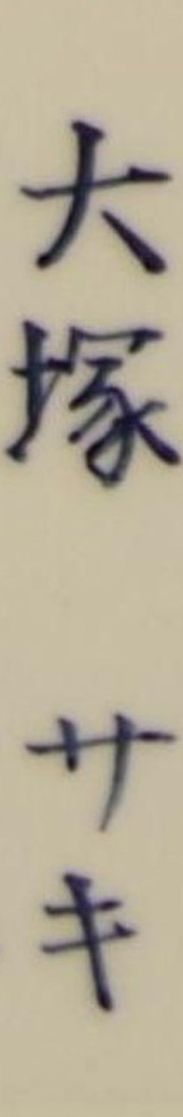大塚サキ
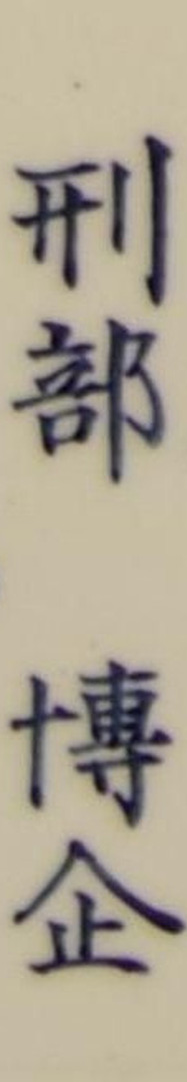刑部博企
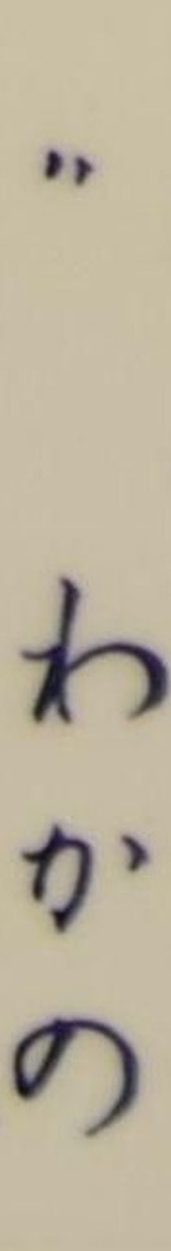わかの
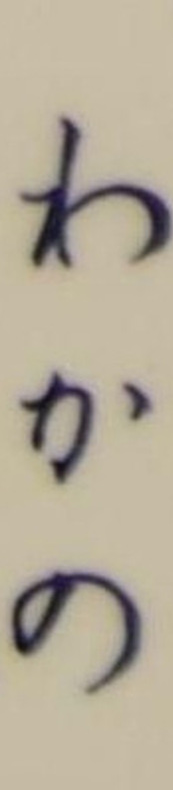わかの
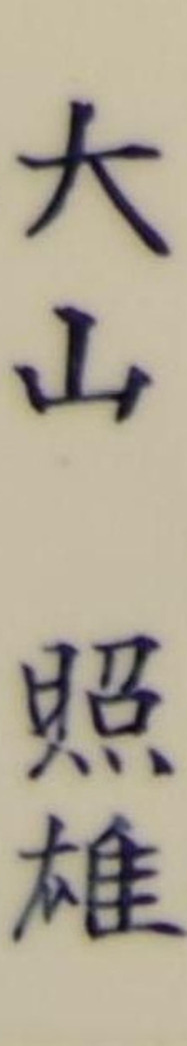大山照雄
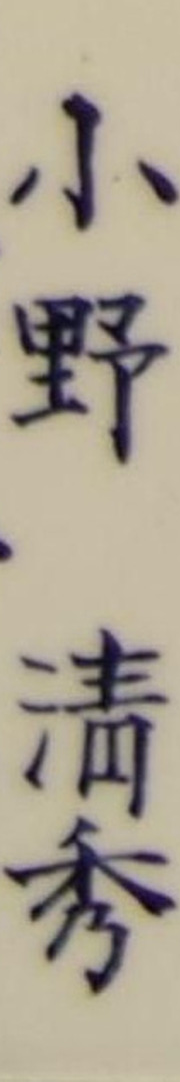小野清秀
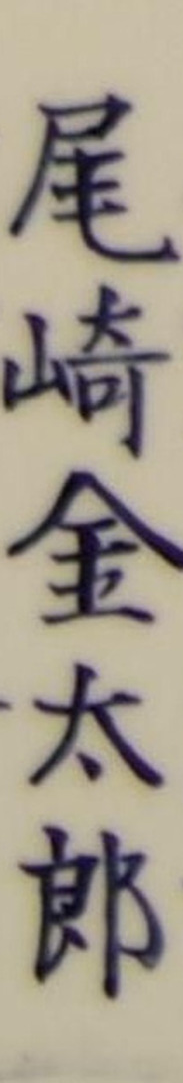尾崎金太郎
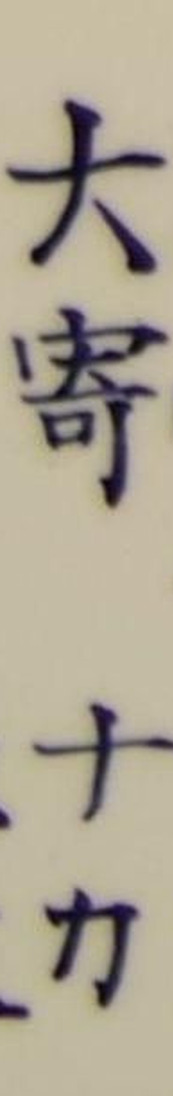大寄ナカ
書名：A~D
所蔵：koyasan kongobuji
